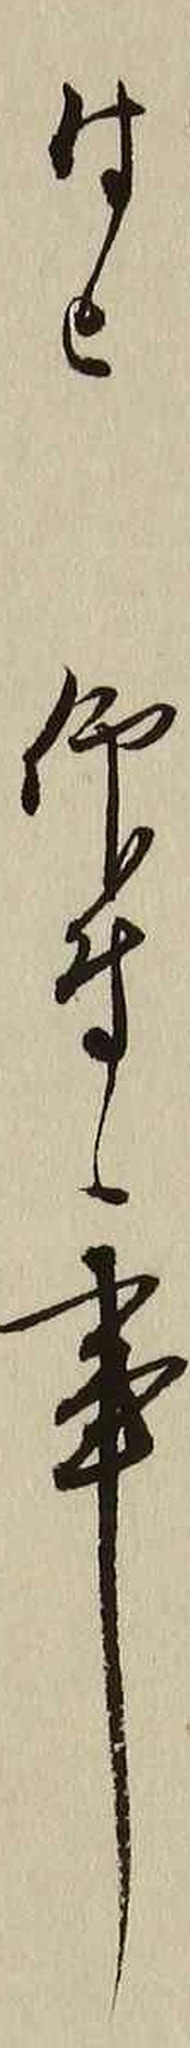付被仰付候事
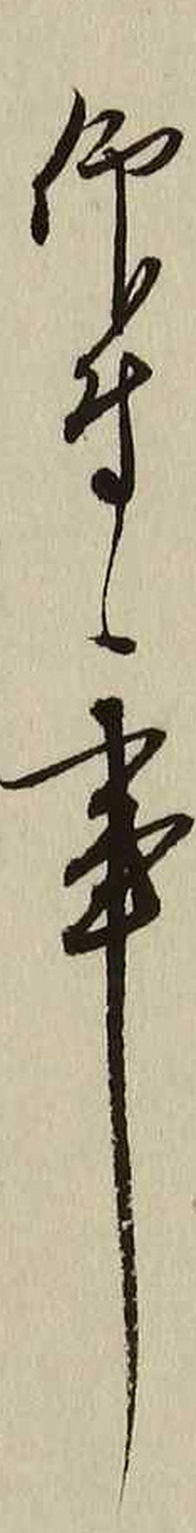仰付候事
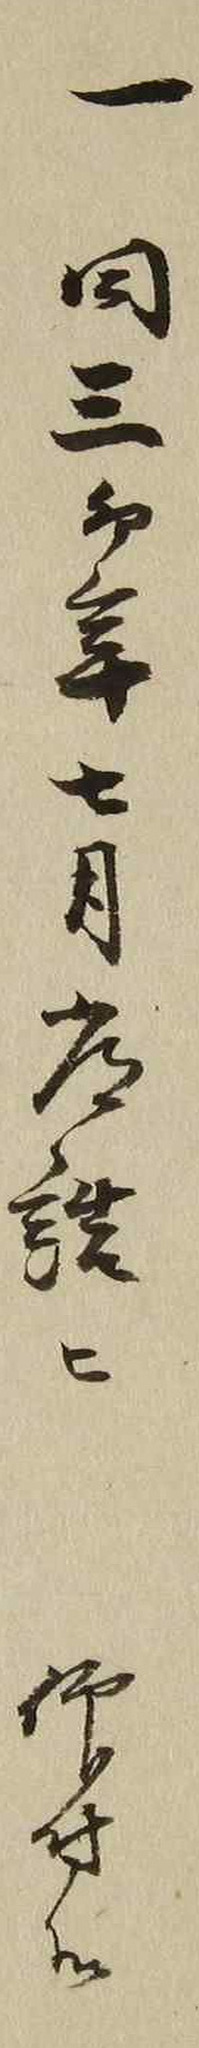一同三卯年七月常詰被仰付候
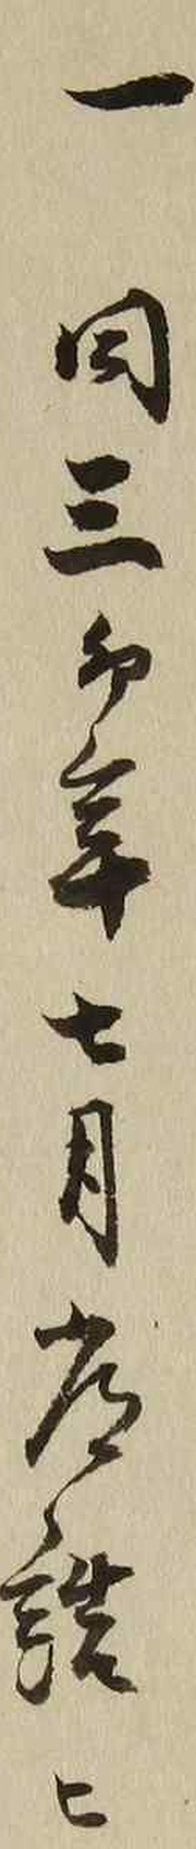一同三卯年七月常詰被仰付候
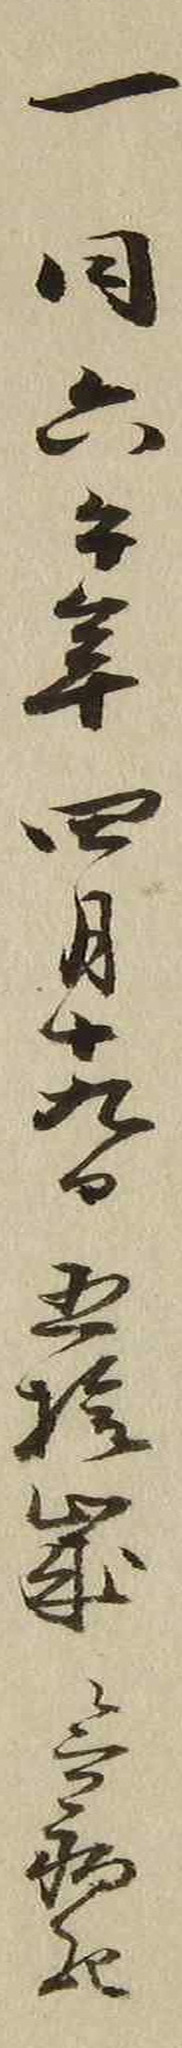一同六午年四月十九日五拾歳に而病死
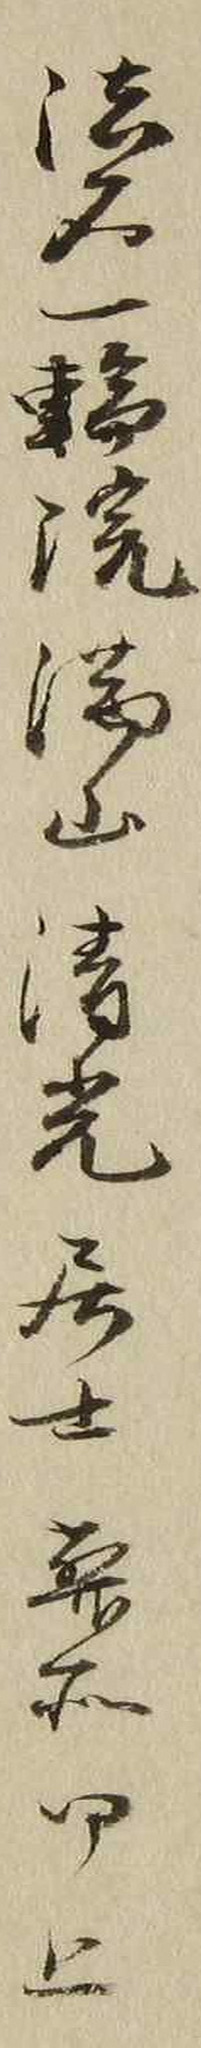法名一輪院満山清光居士葬所同上

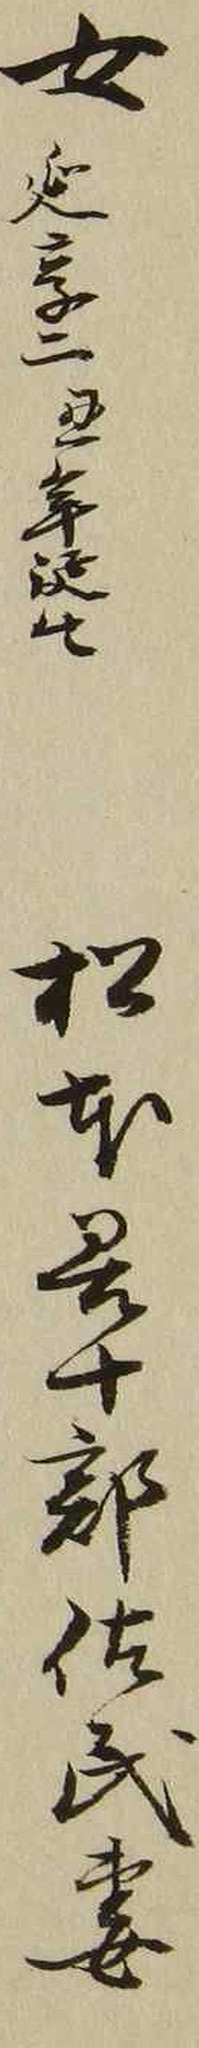女延享二丑年誕生松本善十郎佐民妻
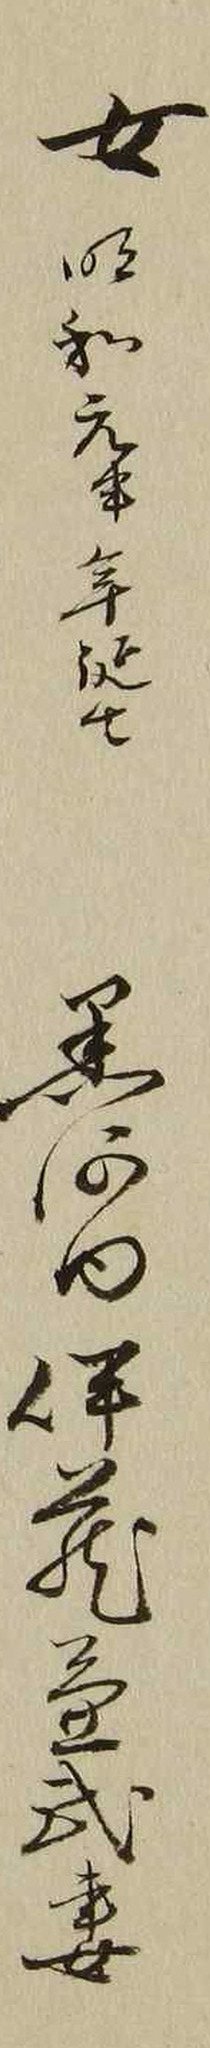女明和元申年誕生黒河内伴蔵兼武妻
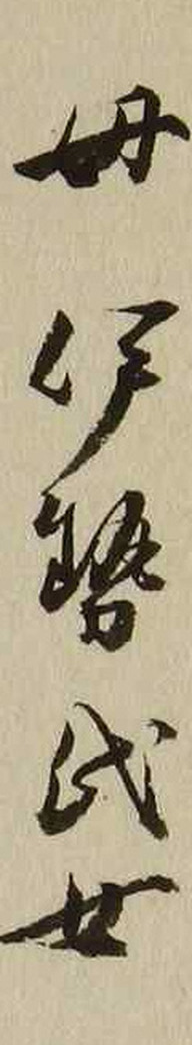母伊勢氏女
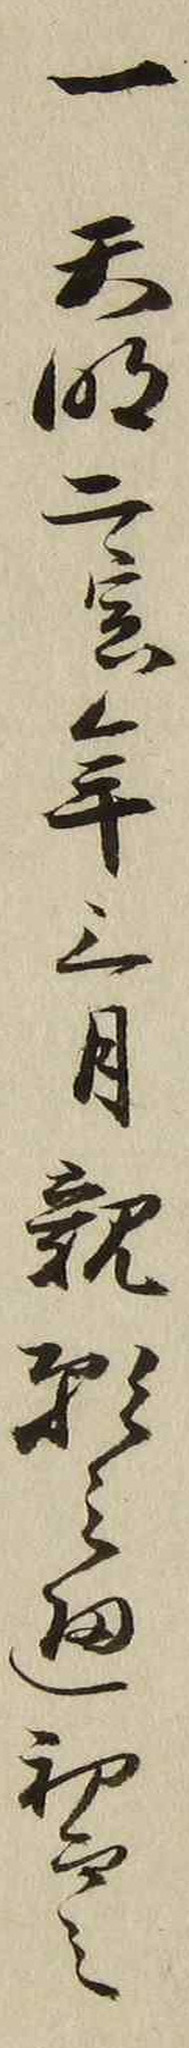一天明二寅年三月親願之通初而之
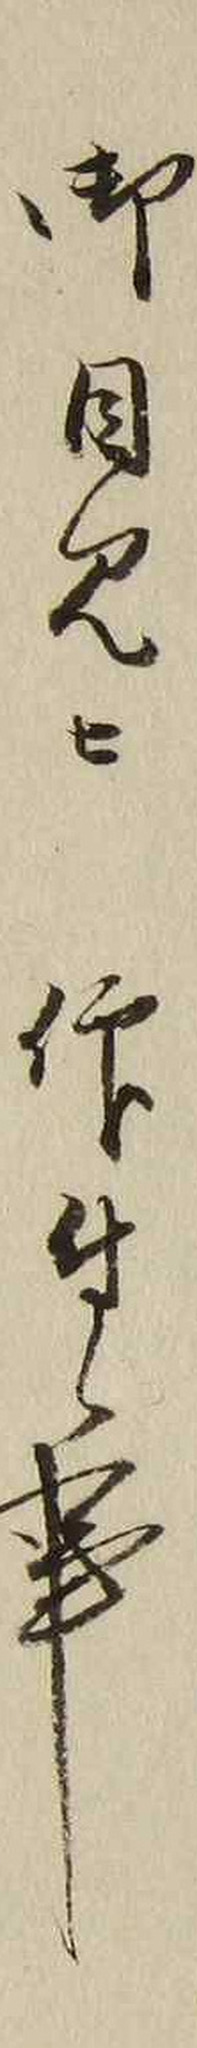御目見被仰付候事
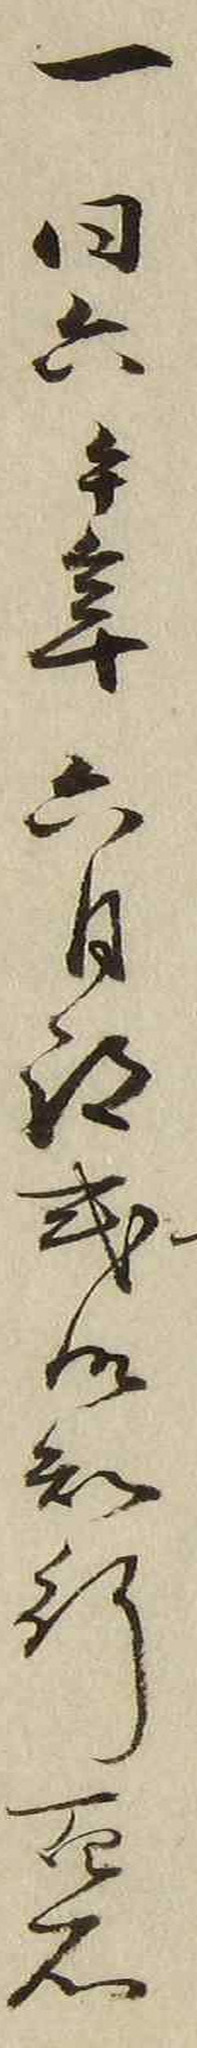一同六丑年六月跡式御知行百石
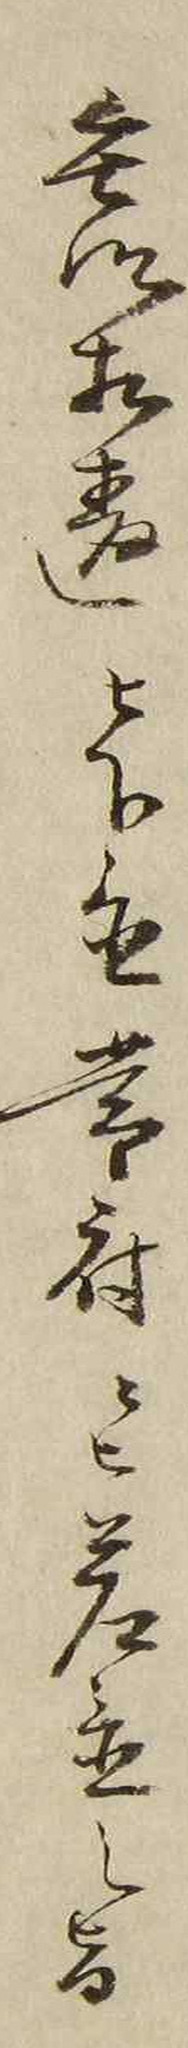無御相違被下置常付に被差置之旨

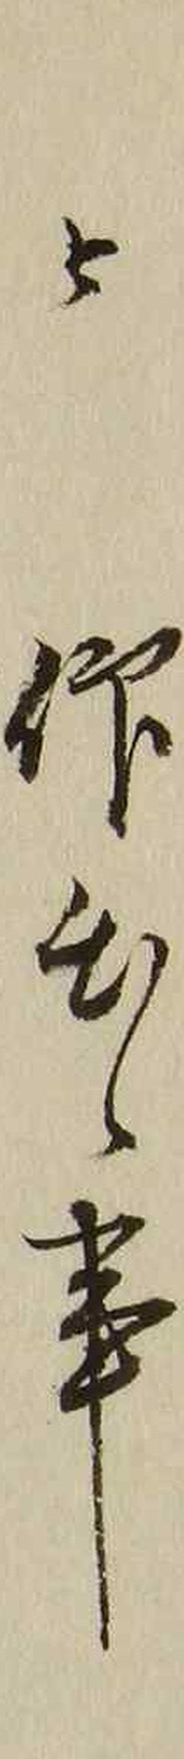被仰付候事
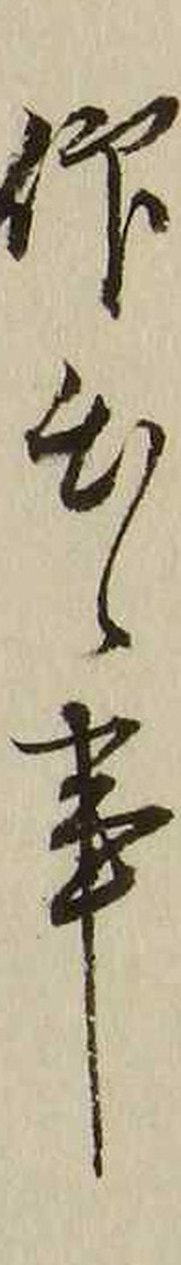仰出候事
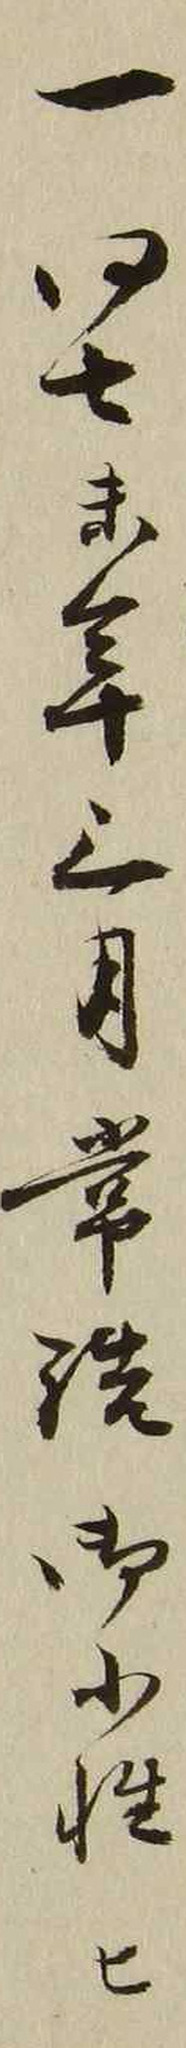一同七未三月常詰御小姓被
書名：諸士系譜　巻之292　き之部1
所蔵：会津若松市立会津図書館
